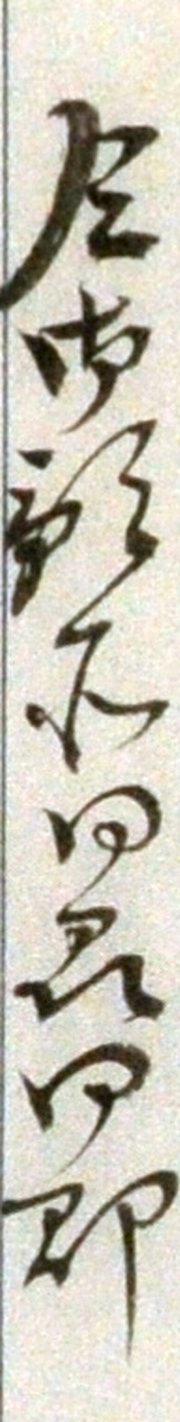同御願所同州同郡
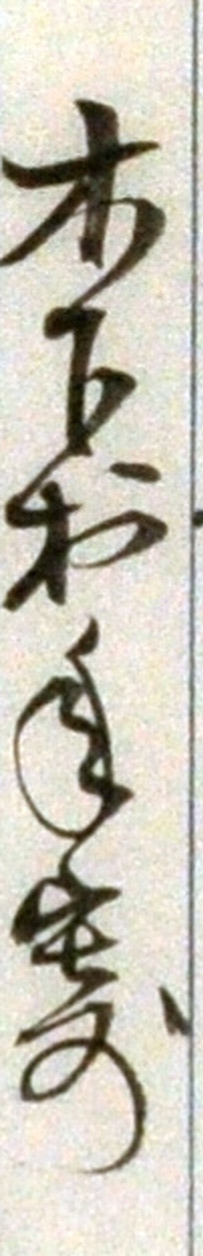木下村年寄
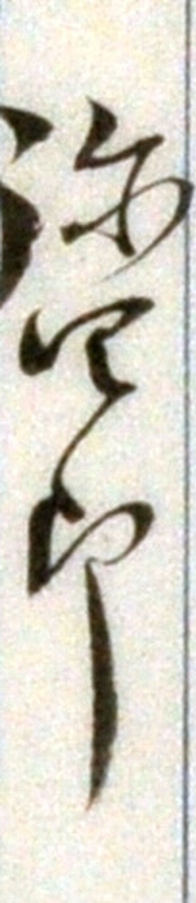弥四郎
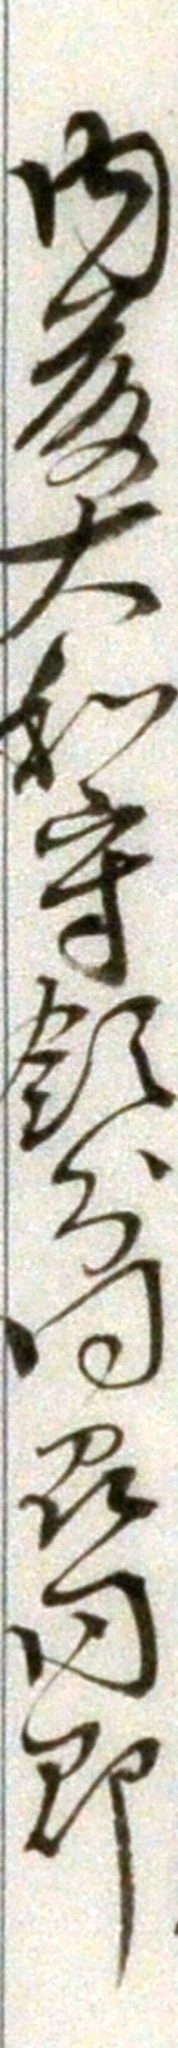内藤大和守領分同州同郡
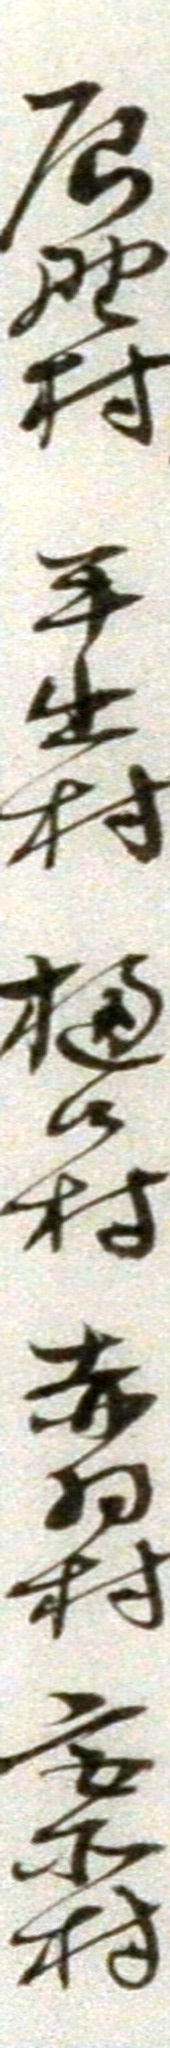辰野村平出村樋口村赤羽村宮所村
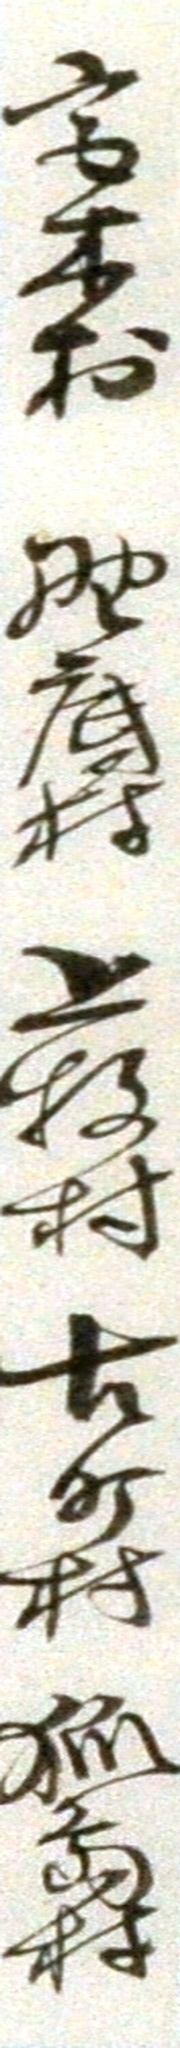高木村野底村上牧村古町村狐島村
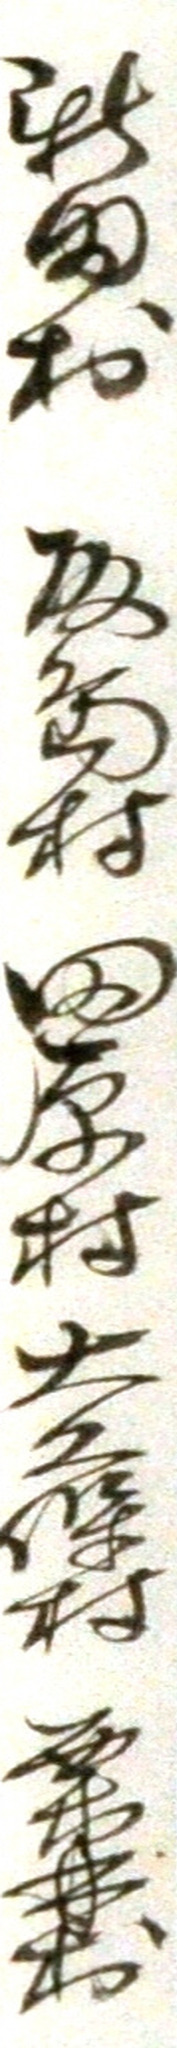新田村坂島村田原村大久保村栗林村

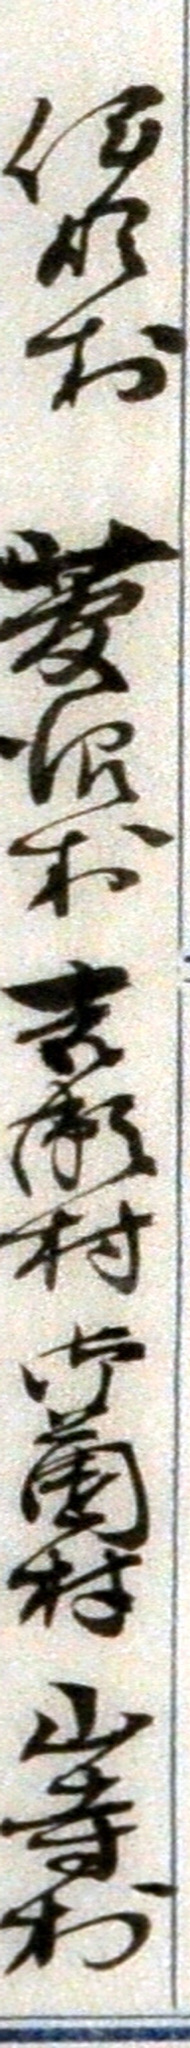伊那村菅沼村吉瀬村御園村山寺村
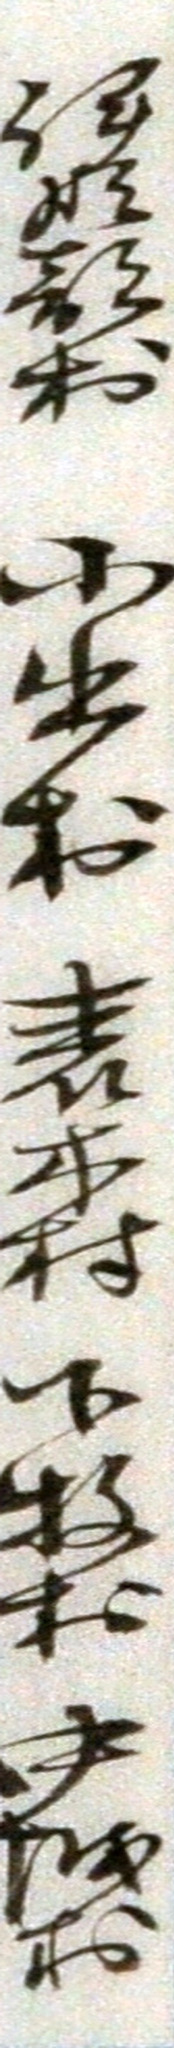伊那部村小出村表木村下牧村中越村
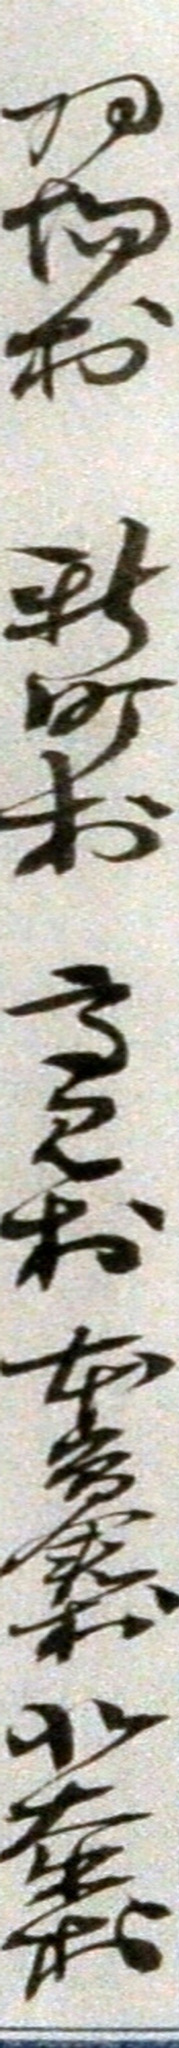羽場村新町村高見村本曽倉村北大出村
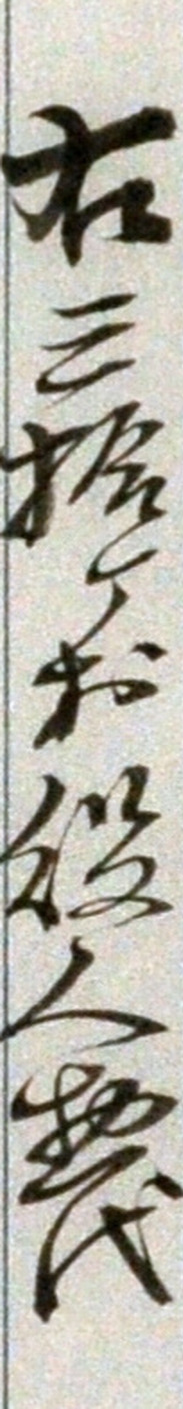右三拾ヶ村役人惣代
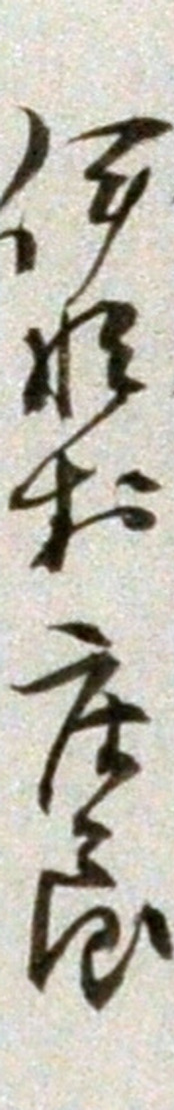伊那村庄屋
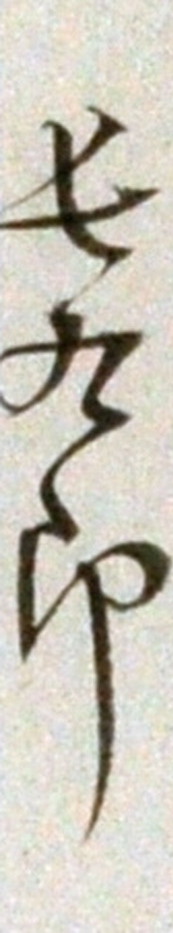長九郎
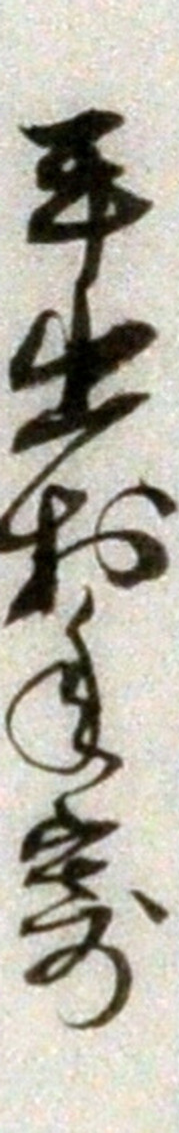平出村年寄
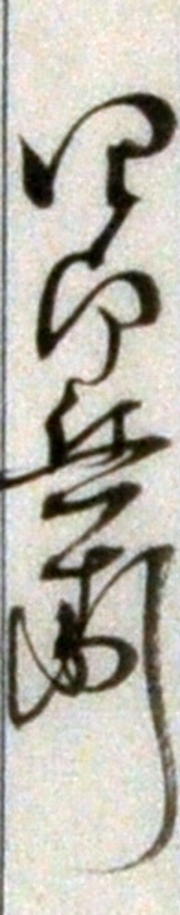四郎兵衛
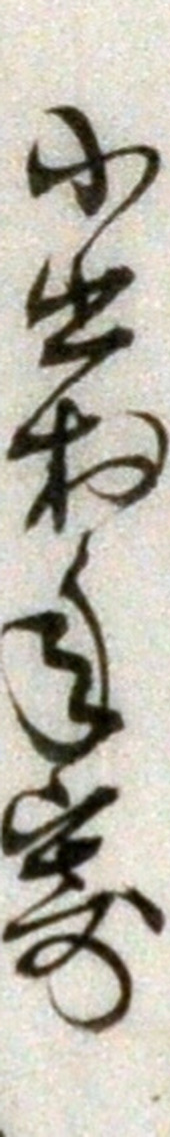小出村年寄
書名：天竜川通船難渋願并取極書
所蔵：伊那市立高遠町図書館・合同会社AMANE
